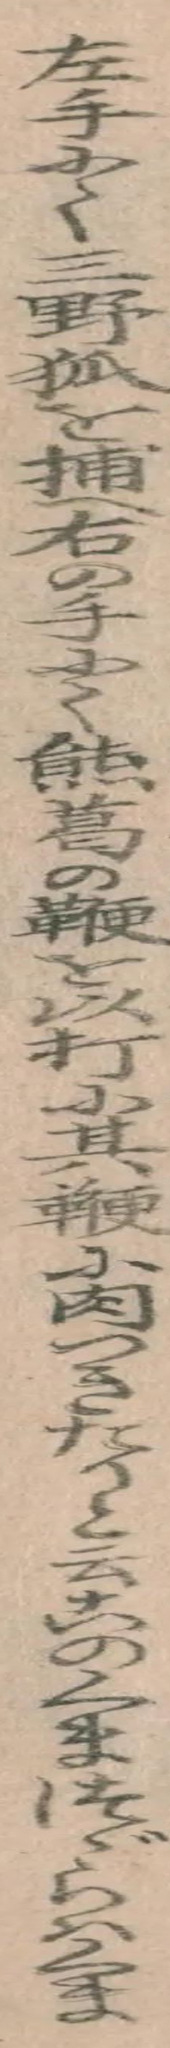左手にて三野狐を捕へ右の手にて熊葛の鞭を以打に其鞭に肉つきたりと云このくまつヾらはくま
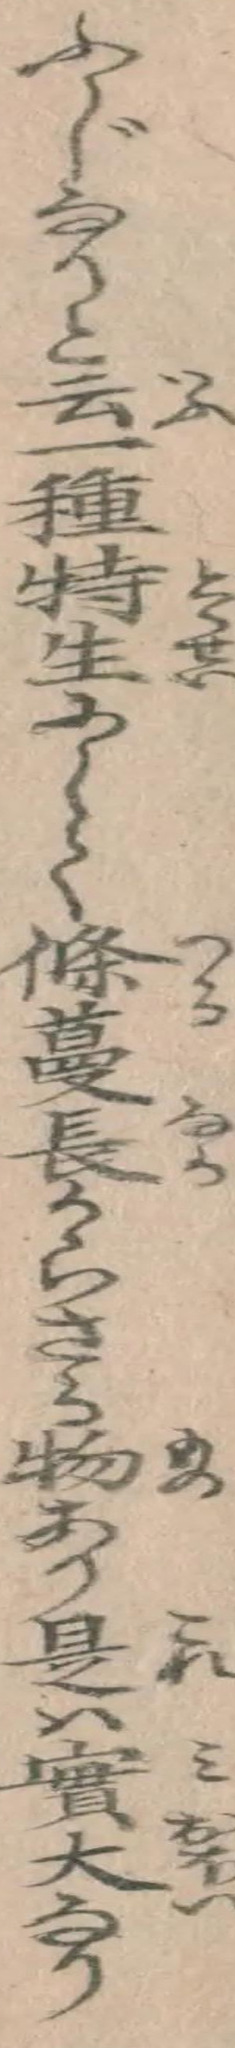ふじなりと云一種特生にして条蔓長からさる物あり是は実大なり

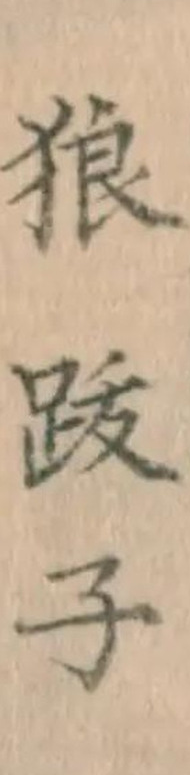狼跋子

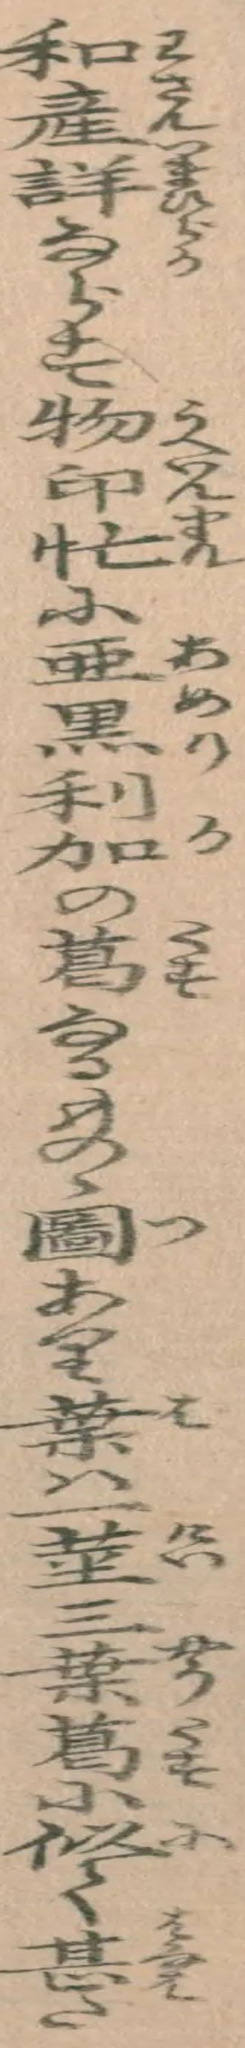和産詳ならす物印忙に亜黒利加の葛なるものゝ図あり葉は一茎三葉葛に似て甚た
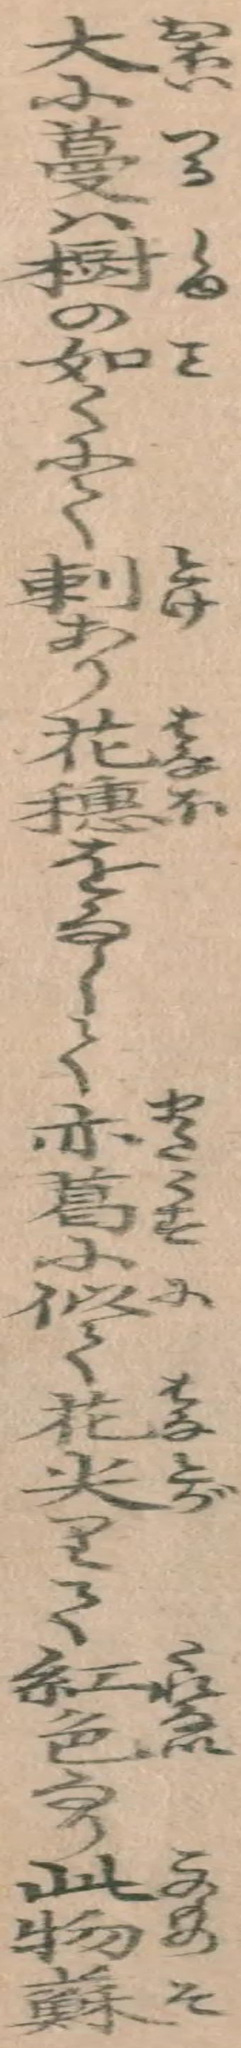大に蔓は樹の如くにて剌あり花穂をなして亦葛に似て花尖りて紅色なり此物蘇
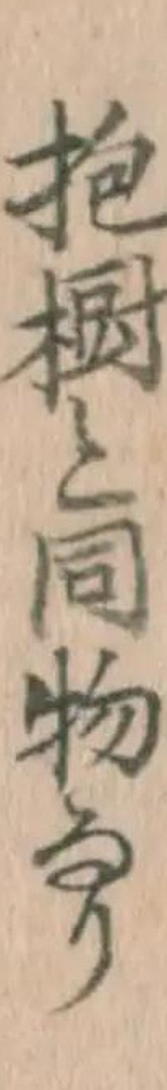抱樹と同物なり
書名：本草図譜. 巻25-27
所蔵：国立国会図書館 National Diet Library, JAPAN
